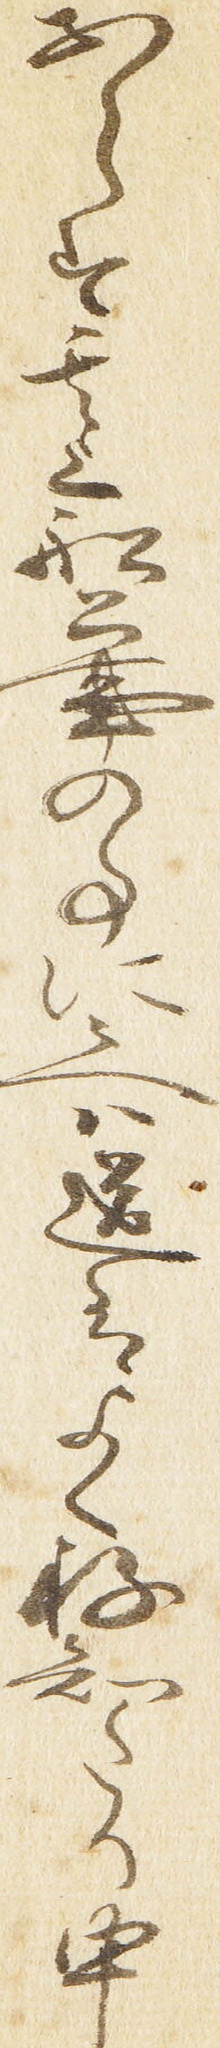あらす其上船公事の事に候へは道はよく存知たり申
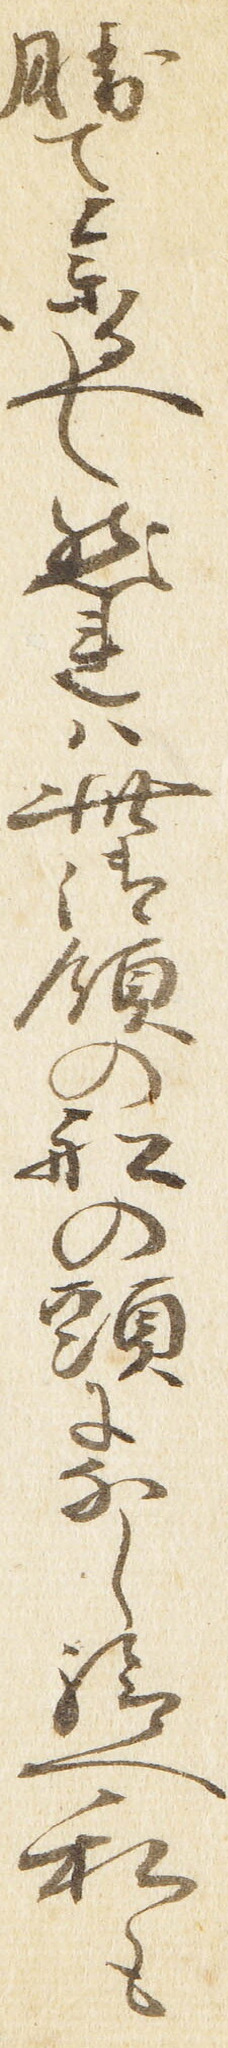勝て参るへし然れは此御領の船の頭になし給へ私も
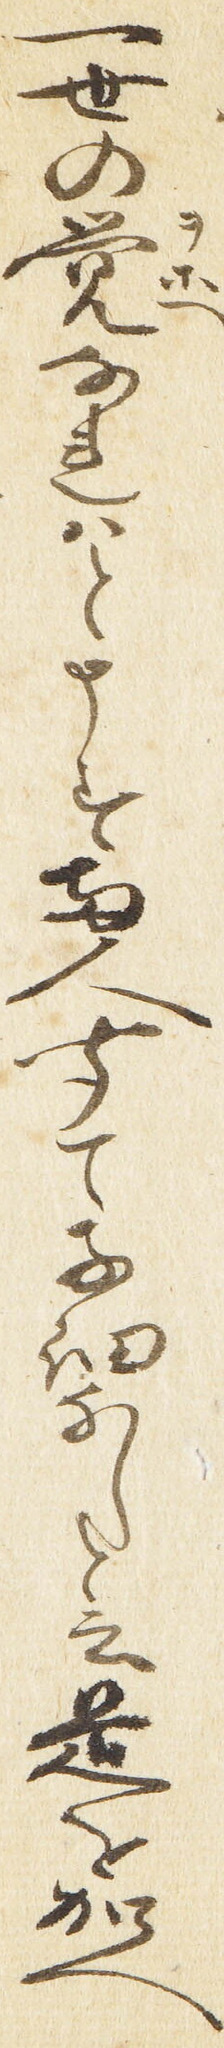一世の覚なれはと申す両人聞て子細なしと云是を加へ
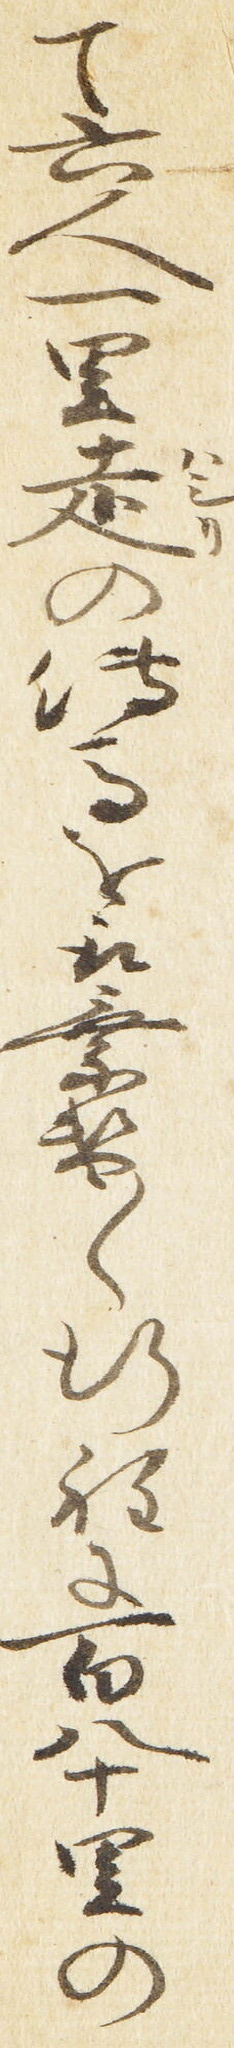て六人一里走の伝馬を取乗替〳〵行程に百八十里の
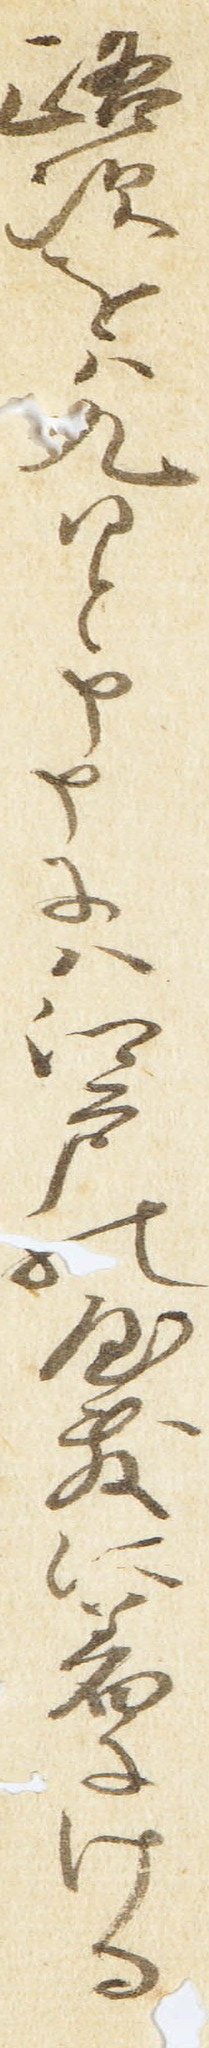路次をは九日と申申には江戸の屋敷に着にける

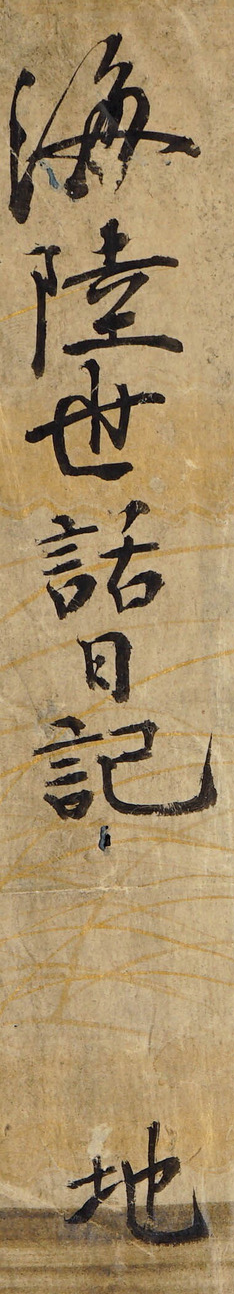海陸世話日記地

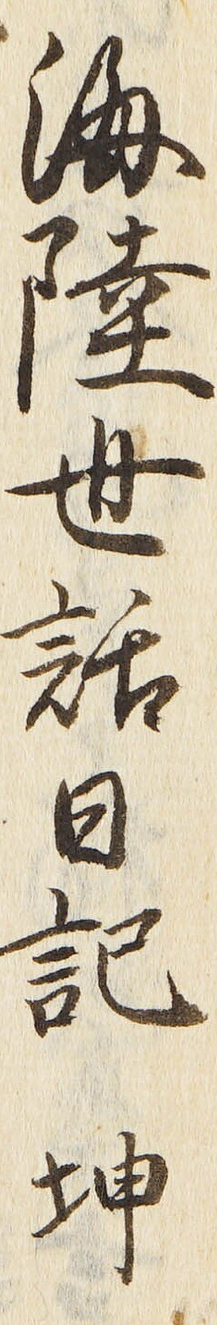海陸世話日記坤
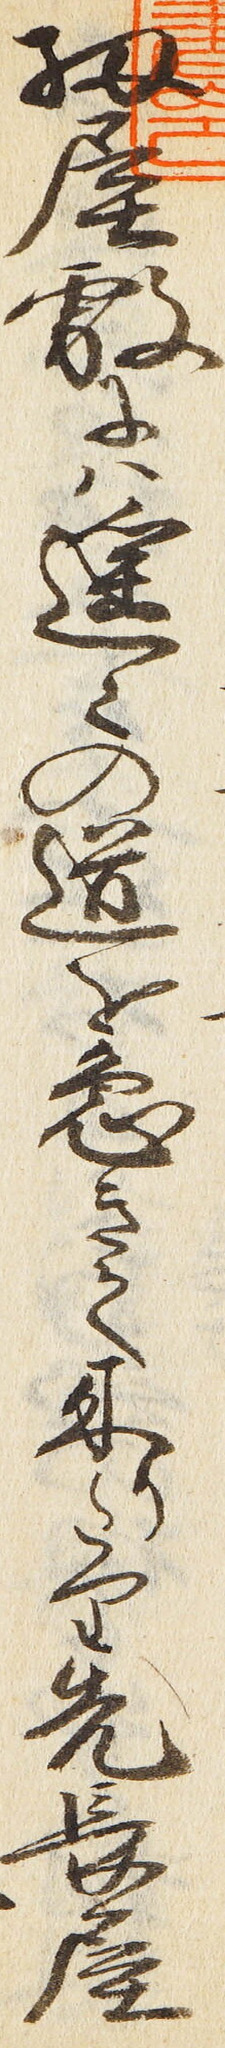扨屋敷には遥々の道を急きて来りたり先長屋
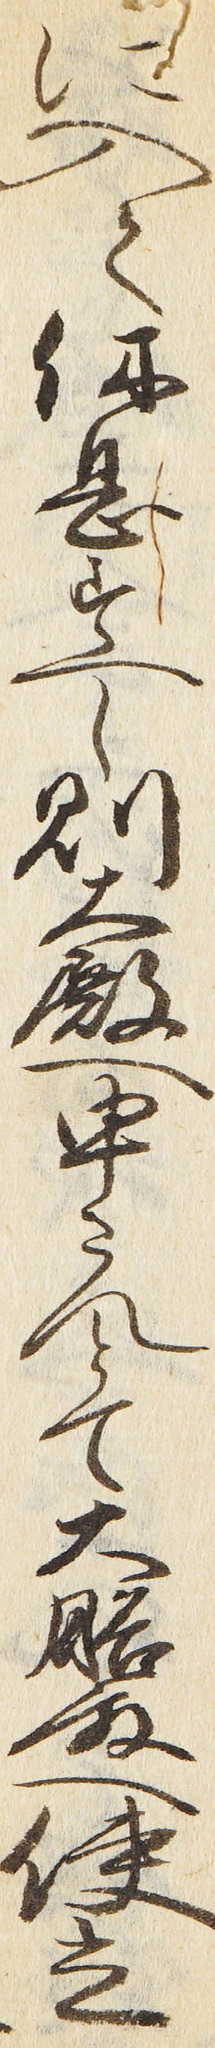に入て休息すへし則大殿へ申さんとて大膳殿へ使立
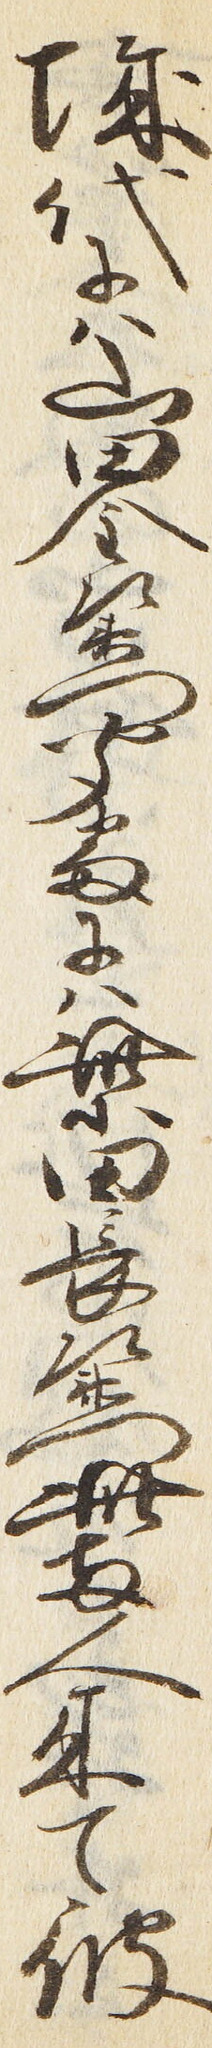城代には山田金左衛門聞番には柴田長左衛門此両人来て彼
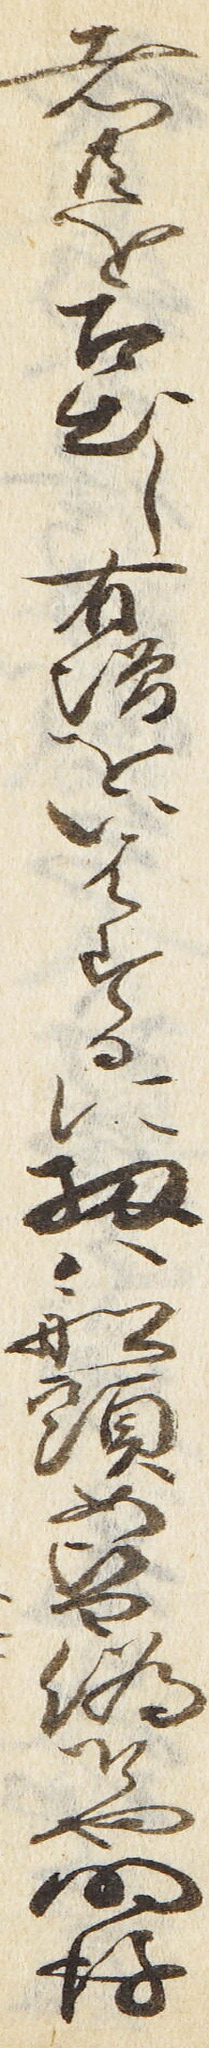者共を召出し有増をいはするに扨は船頭め皆偽そや明後
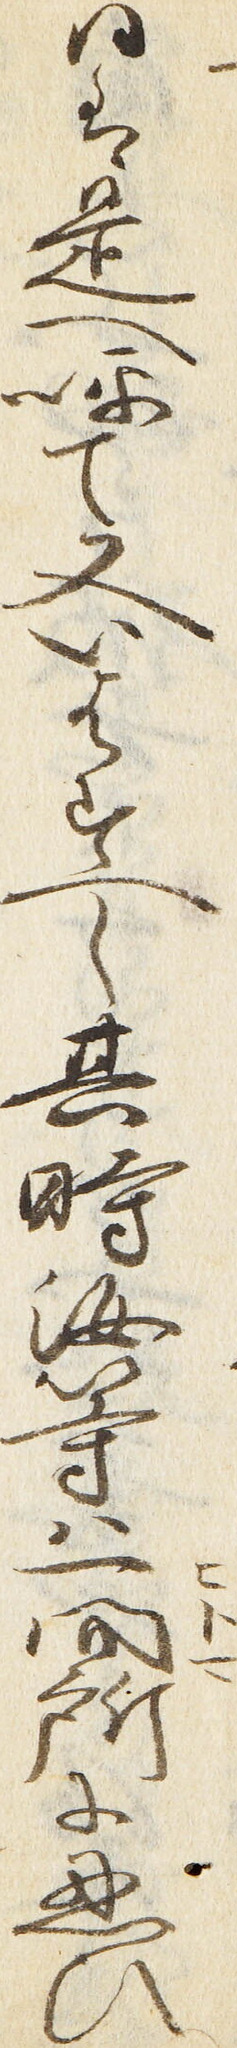日は是へ呼て又いはすへし其時汝等は一間所に忍ひ
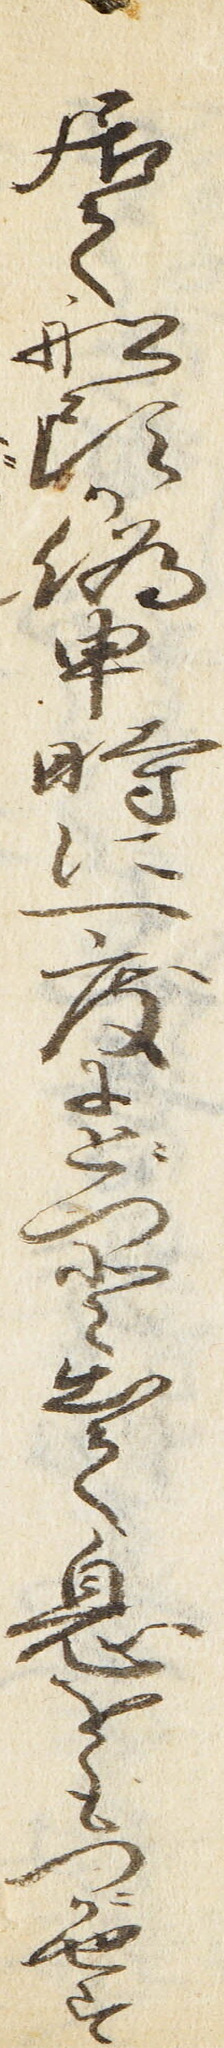居て船頭か偽申時に一度にどつと出て息をもつがせす
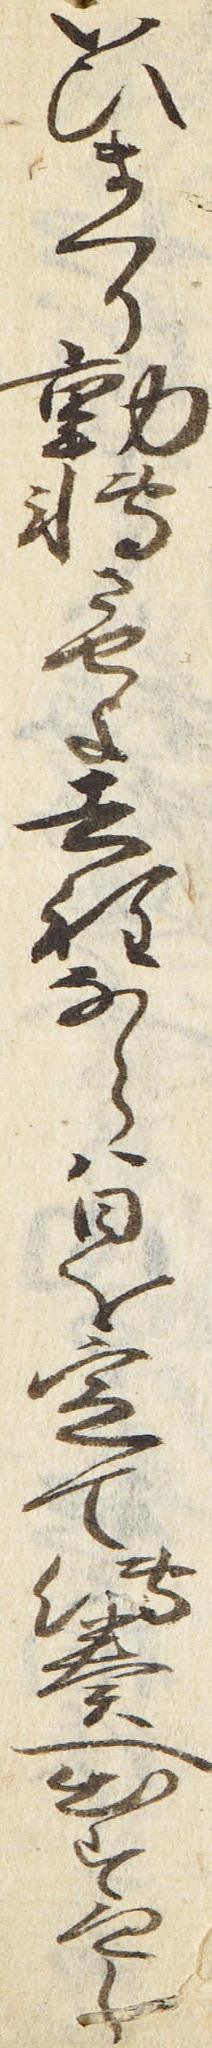いひまつり動転させよ去程ならは日を定て伝奏へ出すへし
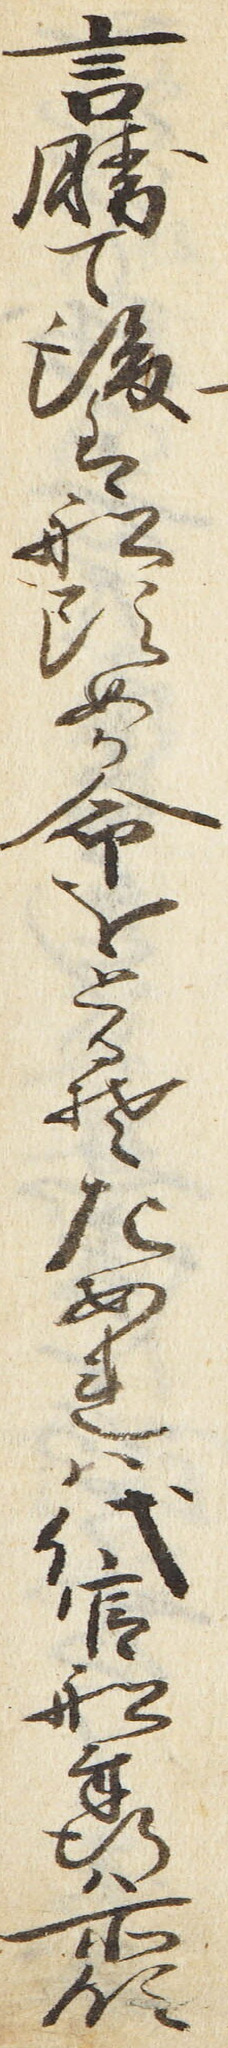言勝て後は船頭めか命をとるそ左あれは代官船奉行は所領

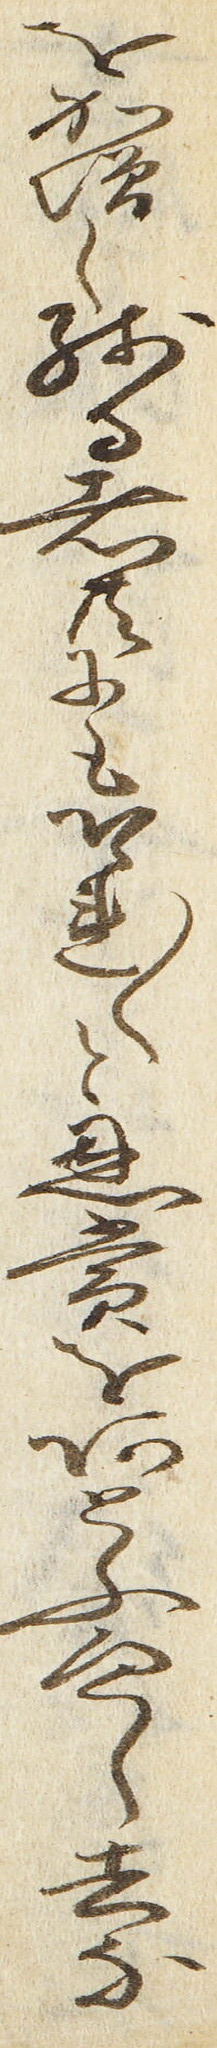を加増し残る者共にもそれ〳〵と恩賞をあとふへし去な
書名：海陸世話日記
